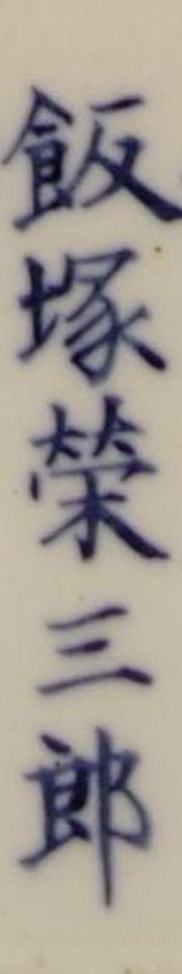飯塚榮三郎
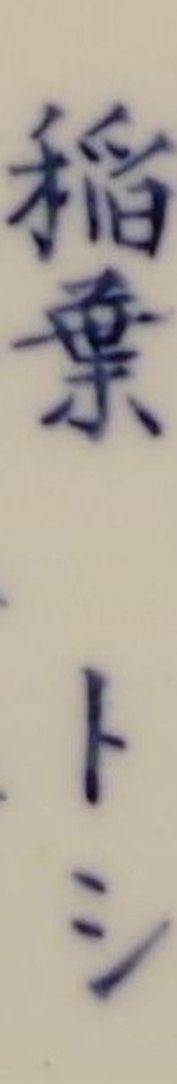稲葉トシ
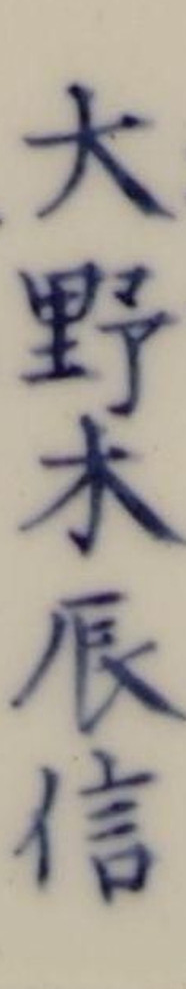大野木辰信
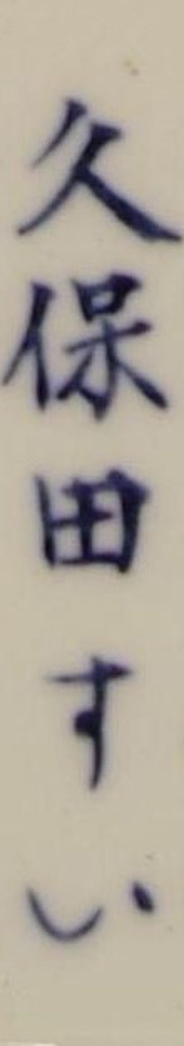久保田すい
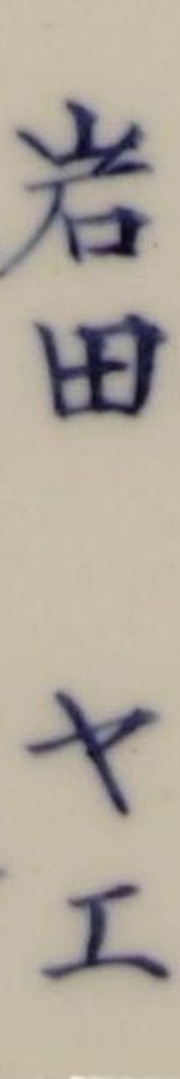岩田ヤエ
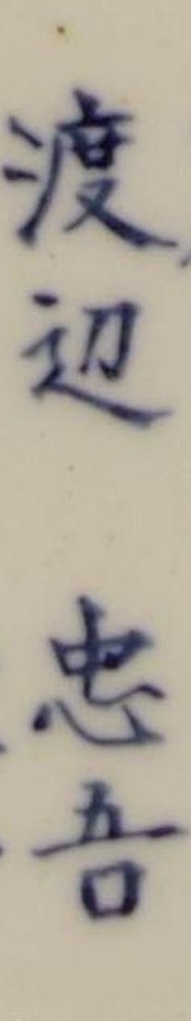渡辺忠吾
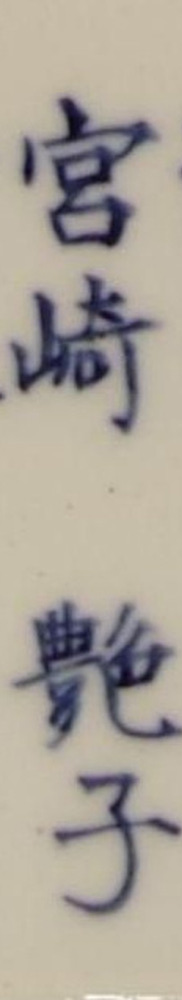宮崎艶子
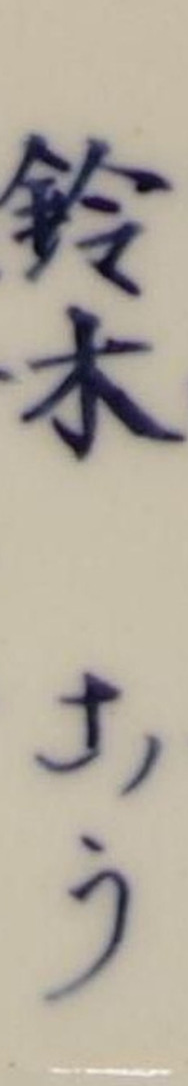鈴木こう
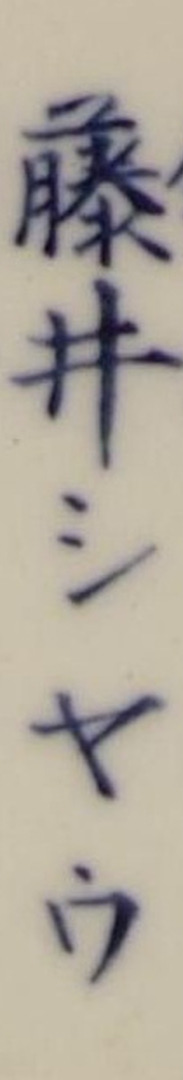藤井シヤウ
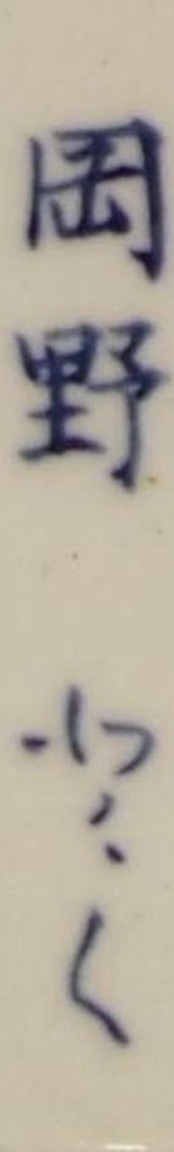岡野とく
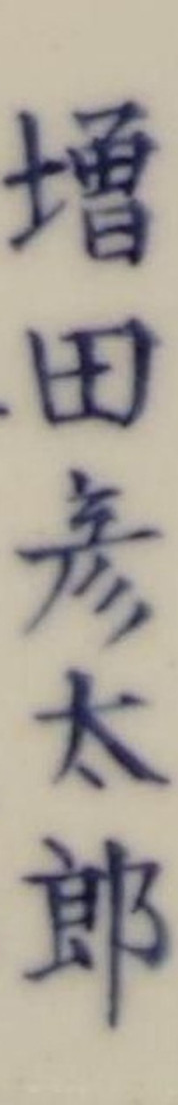増田彦太郎
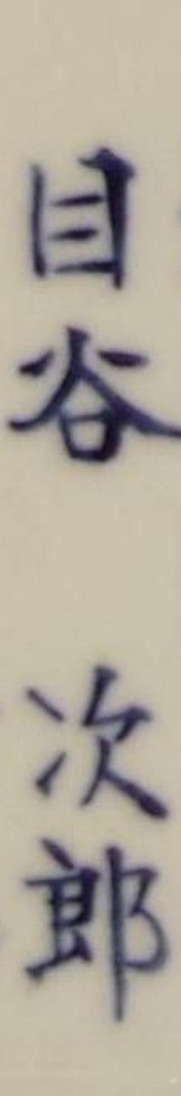目谷次郎

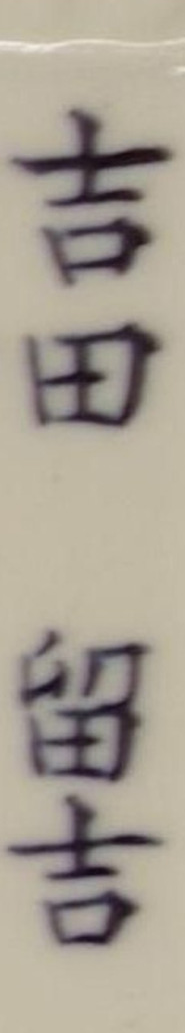吉田留吉
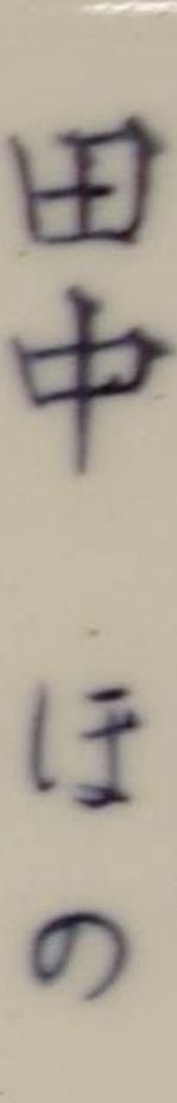田中ほの
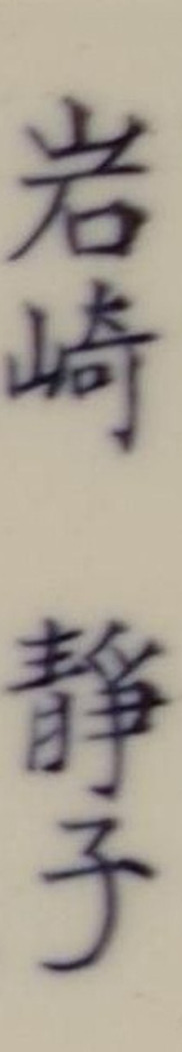岩崎静子
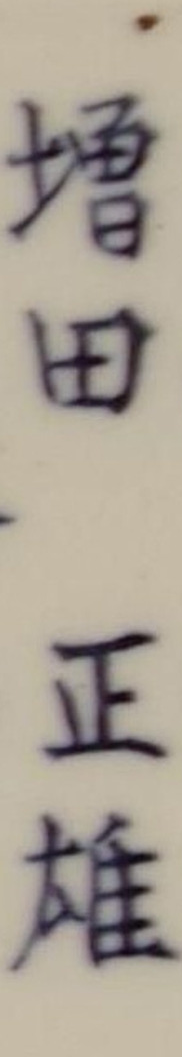増田正雄
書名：E~L
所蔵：高野山金剛峯寺
